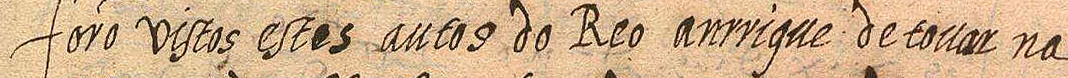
For̅o vistos estes autos do Reo anrrique de touar na
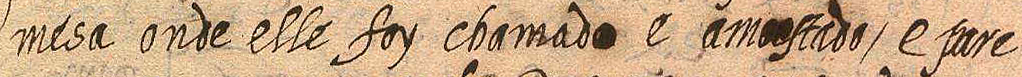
mesa onde elle foy chamado e amoestado / e pare
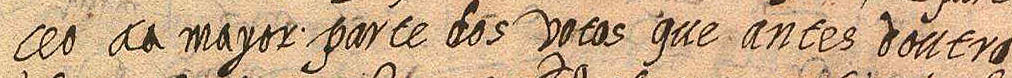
çeo aa mayor parte dos votos que antes doutro
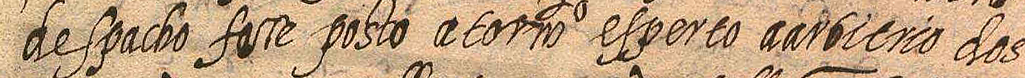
despacho fosse posto a tormto esperto a arbitrio dos
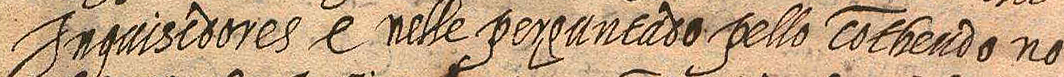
Jnquisidores e nelle perguntado pello c̅otheudo no
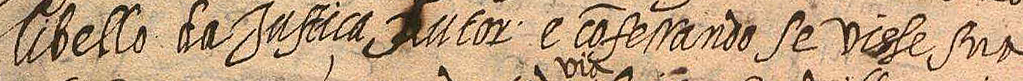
libello da Justiça Autor e c̅ofessando se visse sua
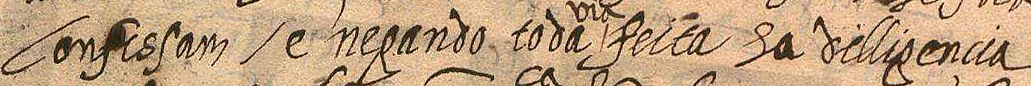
Confissam / e negando todavia / feita ha dilligençia
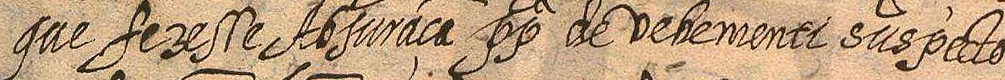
que fezesse Abjuraç̅a ppca de vehementi suspecto
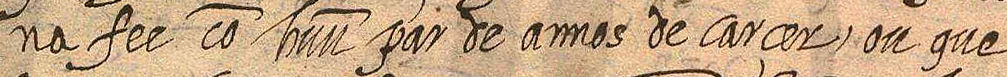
na fee c̅o hu̅u par de annos de carçer/ ou que
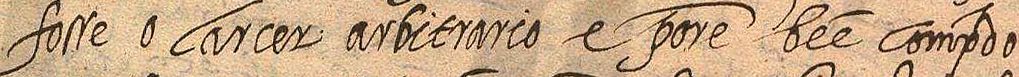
fosse o Carcer arbitrario e p̅ore bee̅ comp̄ido
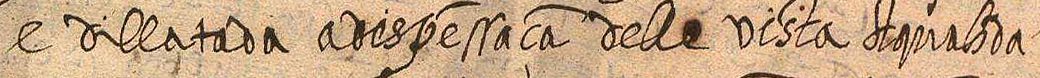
e dillatada a dispe̅ssaç̄a delle vista A qualida
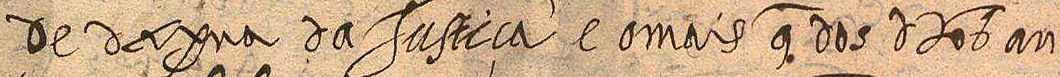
de da ꝓua da Justiça e o mais q̅ dos dto̅s au
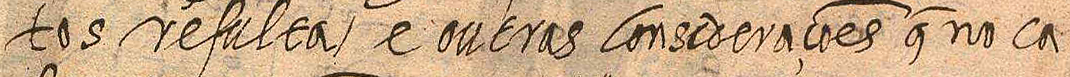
tos resulta / e outras Considerações q̅ no ca
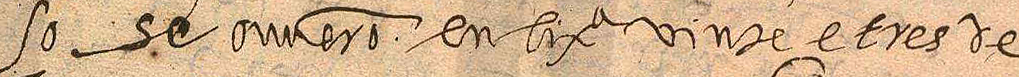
so se ouue̅ro en lixa vinte e tres de
